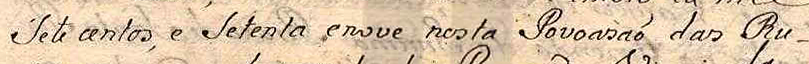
Setecentos, e Setenta e nove nesta Povoasaõ das Ru
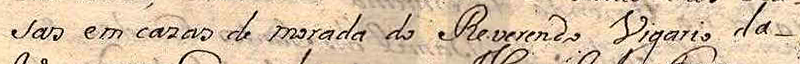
sas em cazas de morada do Reverendo Vigario da
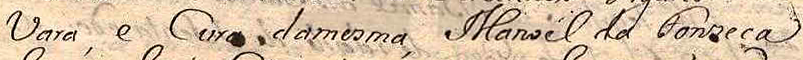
Vara, e Cura da mesma, Manoel da Fonzeca
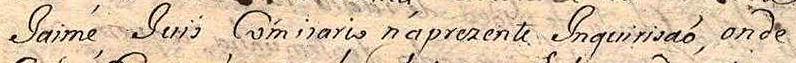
Iaime, Iuis Com̄isario na prezente Inquirisaõ, onde
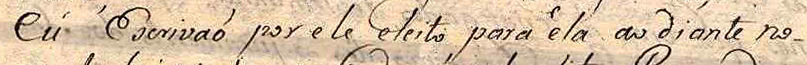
Eu Escrivaõ por ele eleito para ela ao diante no
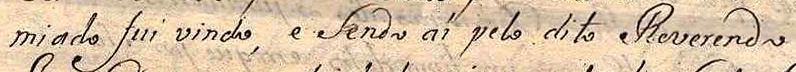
miado fui vindo, e sendo aí pelo dito Reverendo
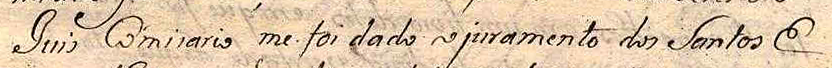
Iuis Com̄isario me foi dado o juramento dos Santos E
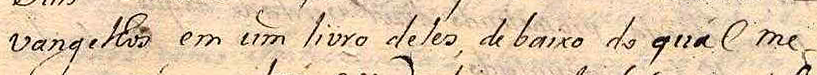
vangelhos em um livro deles debaixo do qual me
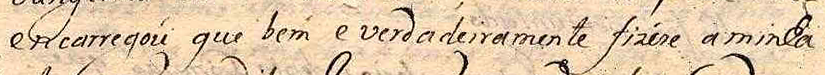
encarregou que bem e verdadeiramente fizese a minha
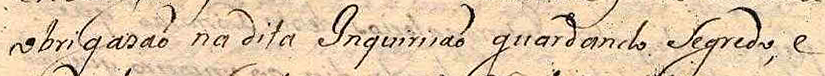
obrigasaõ na dita Inquirisaõ guardando segredo, e
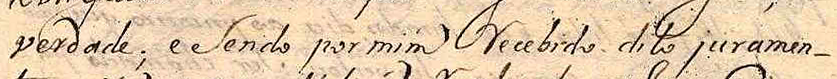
verdade; e sendo por mim Recebido dito juramen
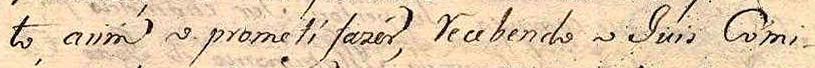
to, asim o prometi fazer, Recebendo o Iuis Com̄i
